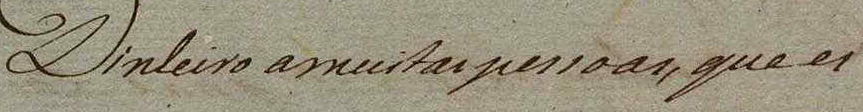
Dinheiro a muitas pessoas, que es
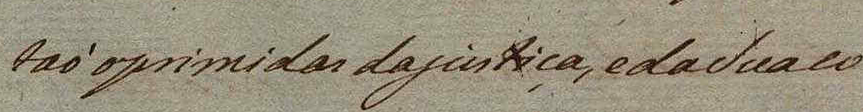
taõ oprimidas da justiça, e da sua co
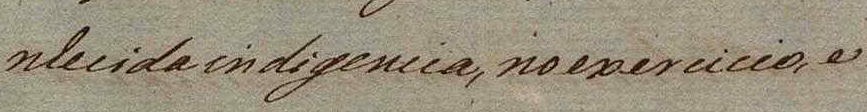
nhecida indigencia, no exercicio, e
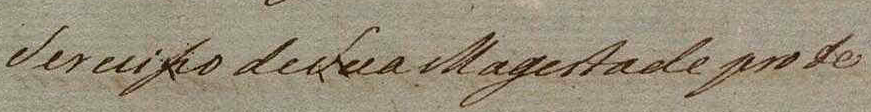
seruisso de Sua Magestade prote
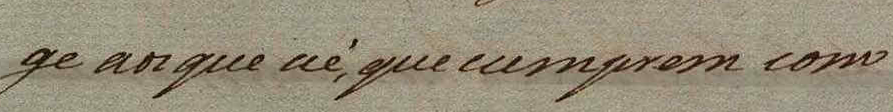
ge aos que ué, que cumprem com
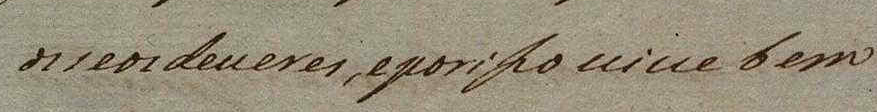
os seos deueres, e por isso uiue bem
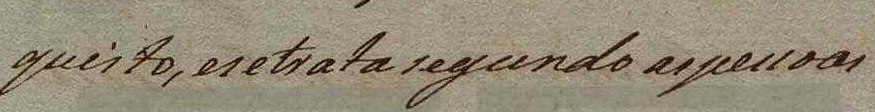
quisto, e se trata segundo as pessoas
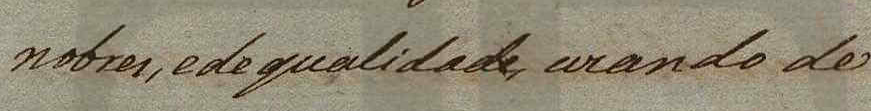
nobres, e de qualidade, uzando de
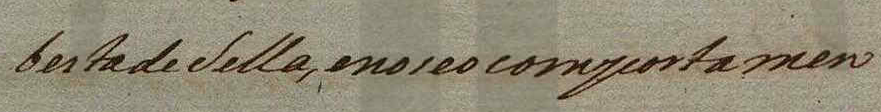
besta de Sella, e no seo comportamen
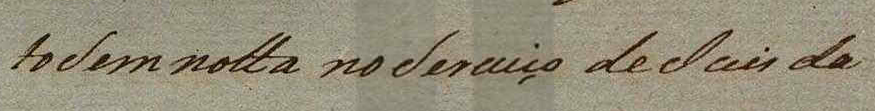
to sem notta no Seruiço de Iuis da
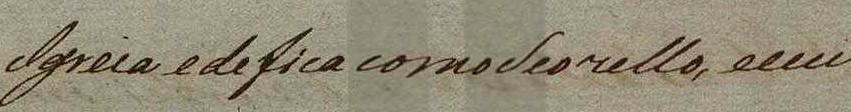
Igreia edefica com o seo zello, e cui
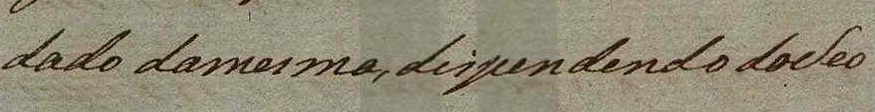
dado da mesma dispendendo do seo
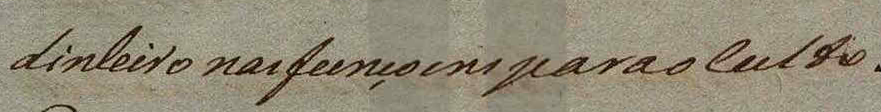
dinheiro nas funçoens para o Culto
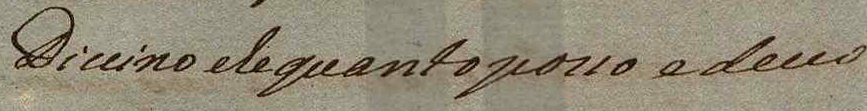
Diuino e he quanto posso e deuo
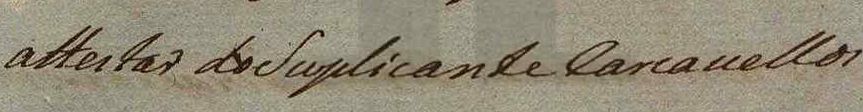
attestar do suplicante Carvauellos
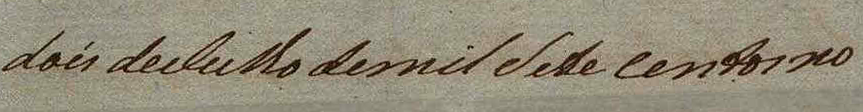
dois de Iulho de mil setecentos no
